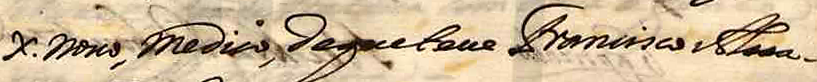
x. nouo, medico, de que teue Francisco Alva
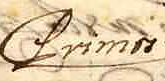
Primos.
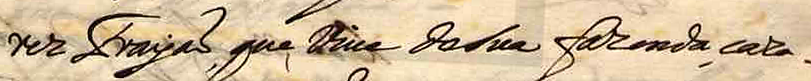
rez Frayaõ, que, vive de sua fazenda, caza
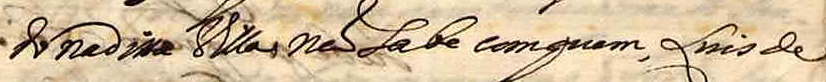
do na ditta Villa, naõ sabe com quem, Luis de
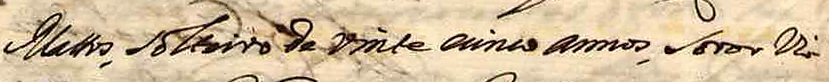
Mattos, solteiro de vinte cinco annos, soror Vio
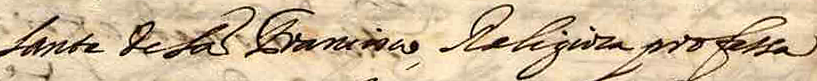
lante de saõ Francisco, Religioza professa
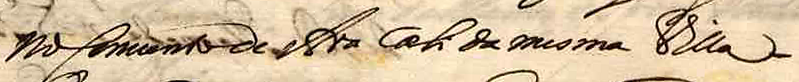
no Convento de Ara Cœli da mesma Villa
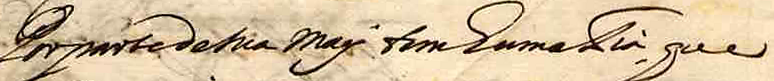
Por parte de sua may tem huma Tia, que
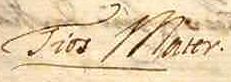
Tios Mater.
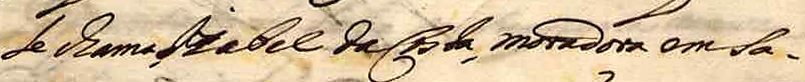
Se chama Isabel da Costa, moradora em Sa
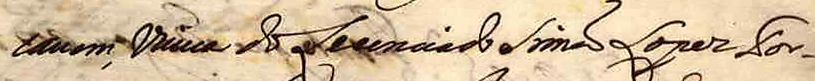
cauem, Viuua do Lecenciado simaõ Lopez Tor
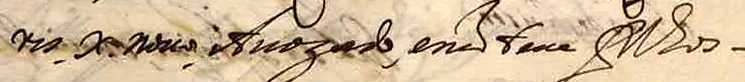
res, x. nouo, Auogado, e naõ teve filhos
